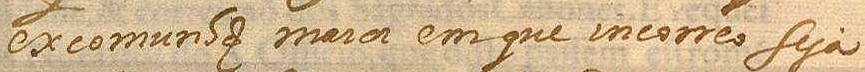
excomunhaõ maior em que incorreo seja
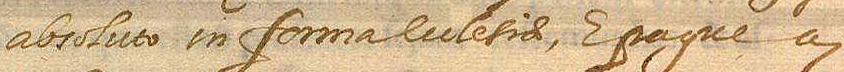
absoluto in forma ecclesiæ, E pague as
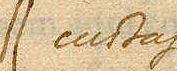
custas
